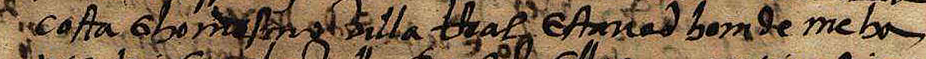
costa e ho mesma villa Real Estauaõ homde me ha
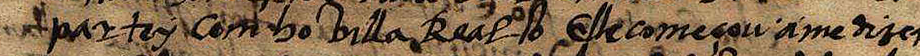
partey com ho villa Real so Elle começou a me dizer
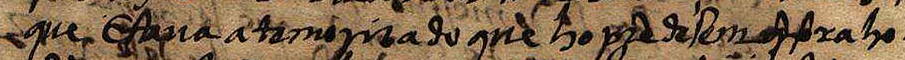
que Estaua atemorizado que ho prēdesem q̄ fora ho
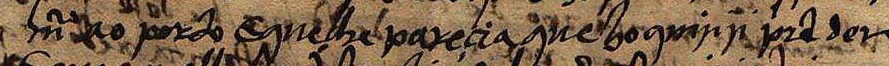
mro ao porto E que lhe parecia que ho quisese prēder
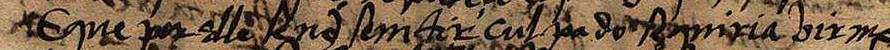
E que por Elle se nō semtir culpado se quiria vir me
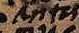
antes
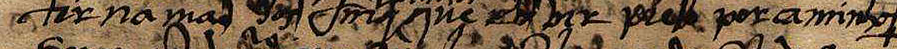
ter na maõ dos Jmq̄rꝭ que se vir preso por caminho
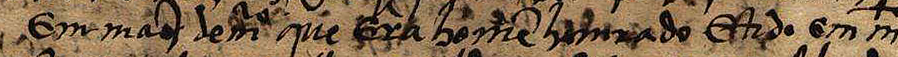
Em maõs de mro que Era homē homrado E tido Em mto
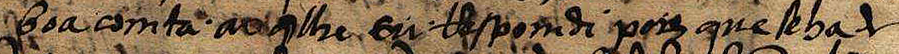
boa comta. ao q̄ lhe Eu Respomdi pois que se hade
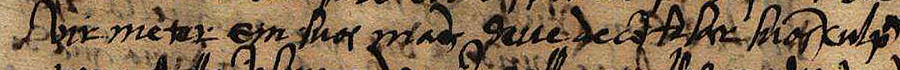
vir meter Em suas maõs deue de cōfesar suas culpas
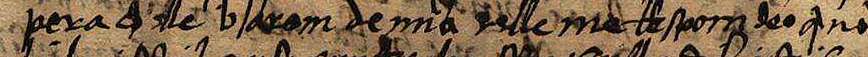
pera cō elle vsarem de mīa e elle me Respomdeo q̄ nō
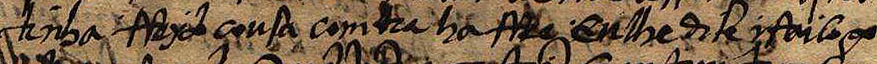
tinha ffeyto cousa comtra ha ffee Eu lhe dise istai logo
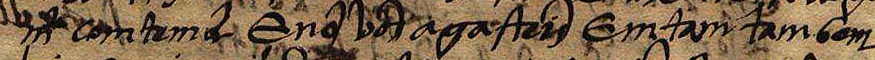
mto comtemte E nō vos agasteis Emtam tambem
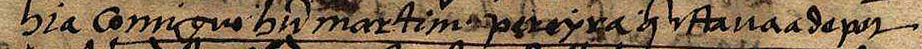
hia comiguo hū martim pereyra q̄ estaua a depor
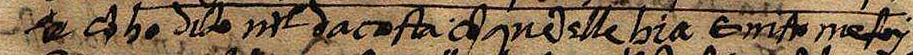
e cō ho dito mel da costa cō quē Elle hia E nisto me foy
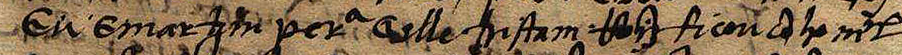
Eu E martim pera E elle tristam Roiz̄ ficou cō ho meL
